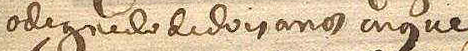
o degredo de dois anos en que
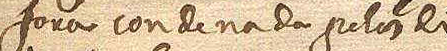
fora condenada pelos di
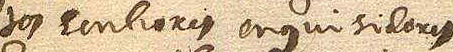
dos senhores enquisidores
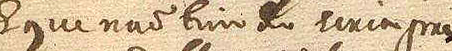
E que naõ hindo seria pre
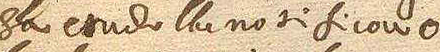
sa e tudo lhe notificou o
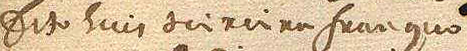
Dito luis teixeira franquo
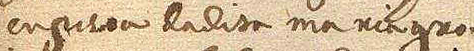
en pesoa da dita maria gro
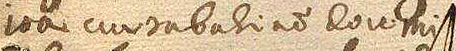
ioa e eu tabaliaõ dou mi
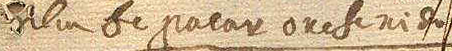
nha fe pasar o referido
